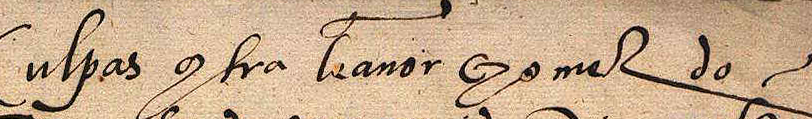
culpas ꝯtra lianor Gomez do
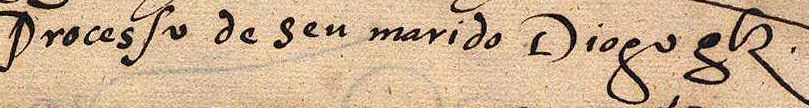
Processo de seu marido Diogo glz.
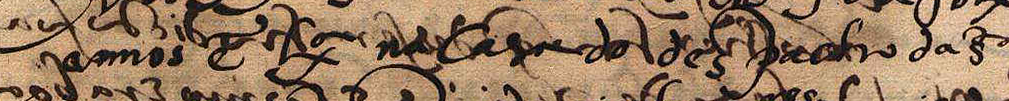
annos ē Lxa na Casa do despacho da sta
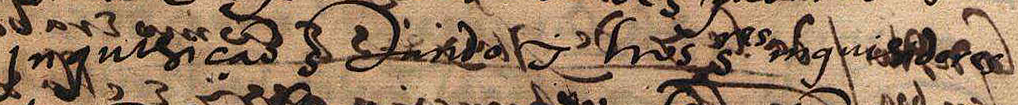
jnquisição stando y hos s.res inquisidores
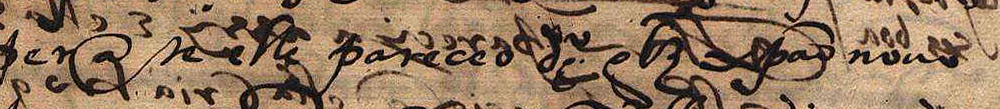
perāte elle pareceo do glz̄ xpão nouo
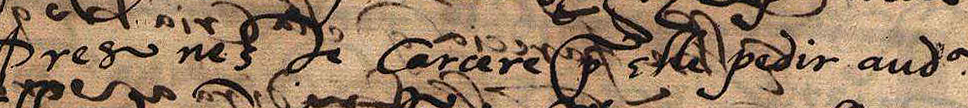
Preso neste carcere ꝑo lhe pedir auda
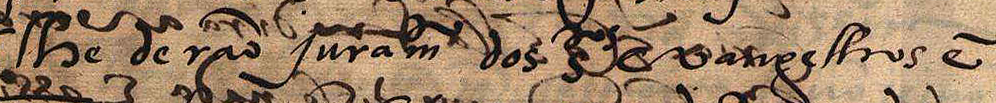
E lhe derão Juramto dos Stos evangelhos ē
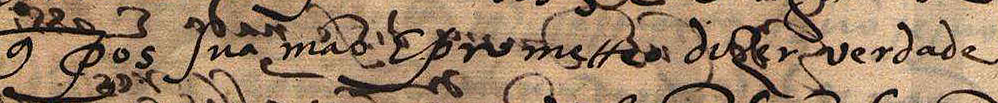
q̄ pos sua maõ E prometteo dizer verdade
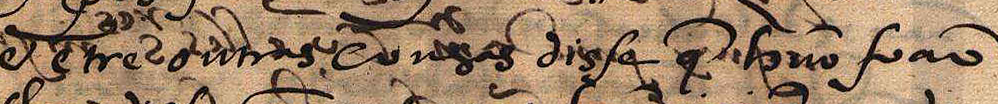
e ētre outras cousas disse q̄ huō foão
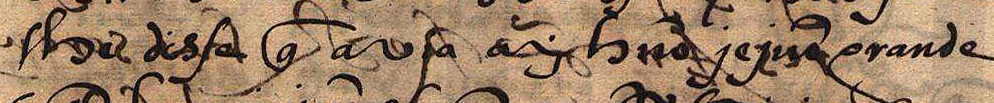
lhe disse q̄ avia ay huō jejuō grande
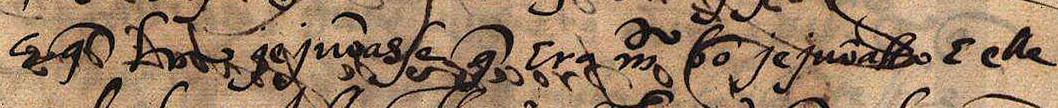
E q̄ se jejuōasse q̄ era mto bō jejuōallo E elle
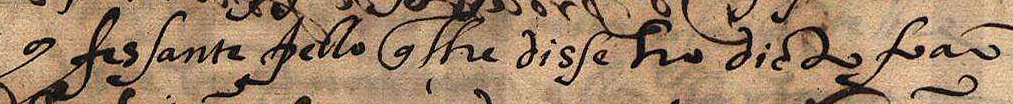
ꝯfessante pello q̄ lhe disse ho dicto foaõ
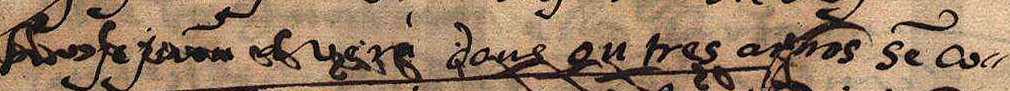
ho Jejuōu auera dous ou tres annos sē co //
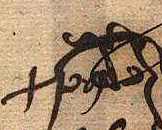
tpꝯ̄
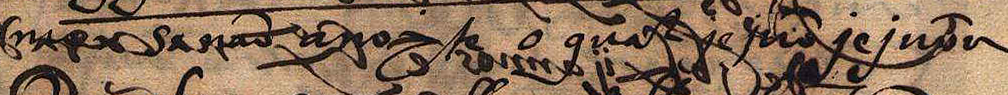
mer senão a noyte o qual jejuō jejuōu
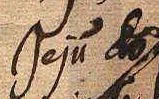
Jejū do
